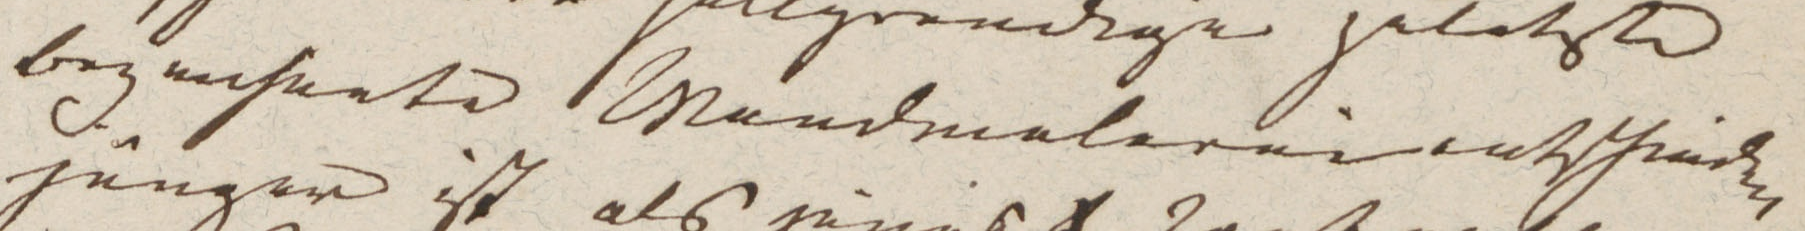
bezeichnete Wandmalerei entschieden
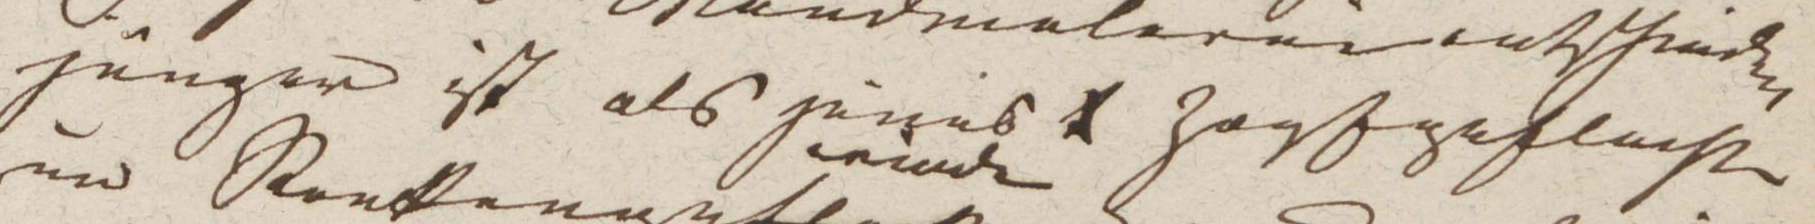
jünger ist als jenes Zopfgeflecht
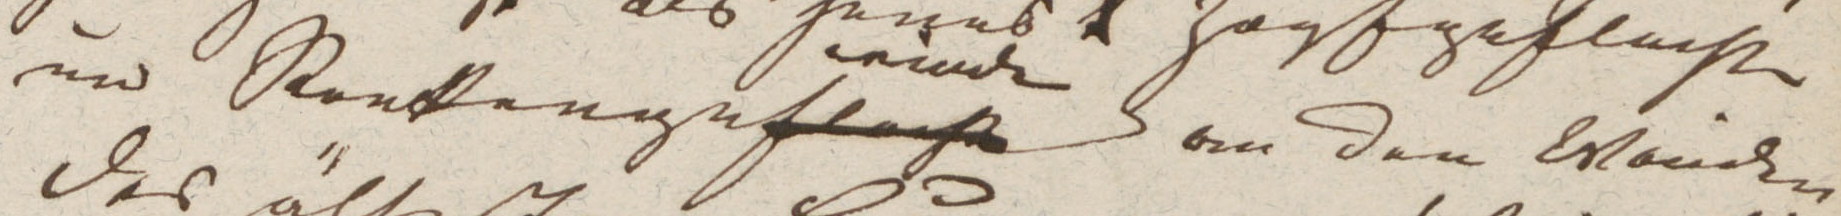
und Rankengeflechtwinde an den Wänden
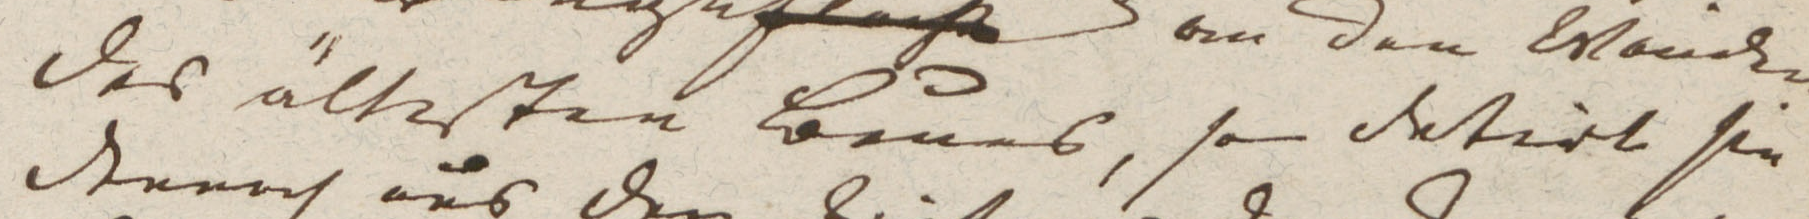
des ältesten Baues, so datirt sie
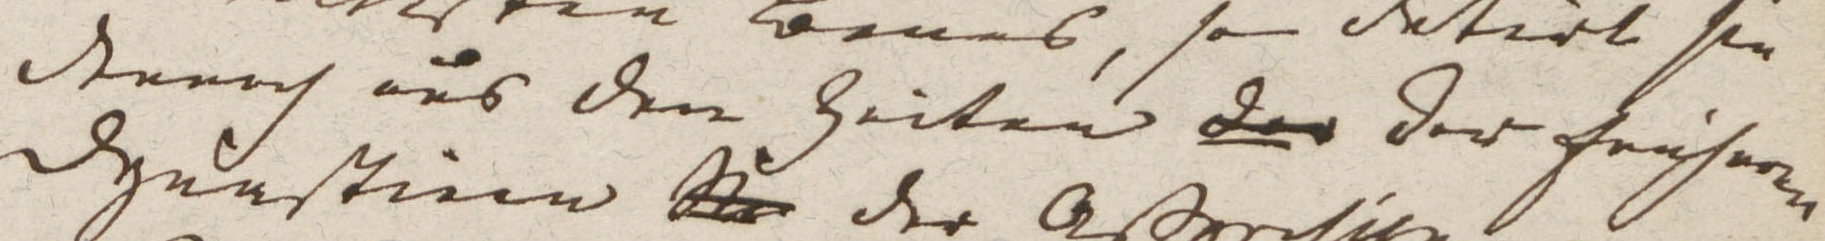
dennoch aus den Zeiten der der früheren
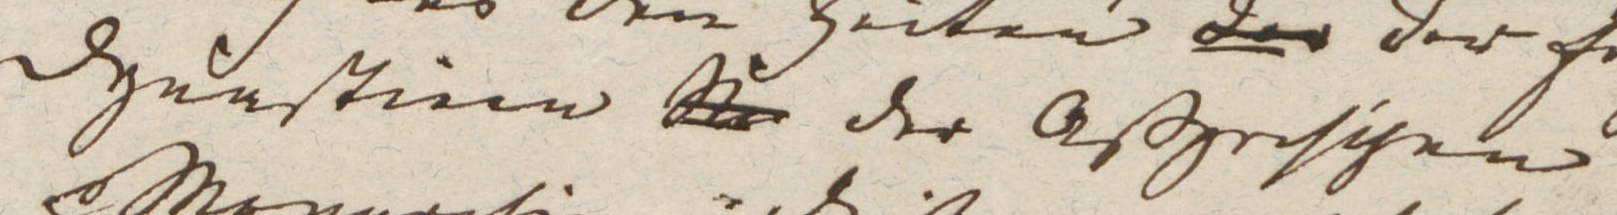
Dynastieen der Assyrischen
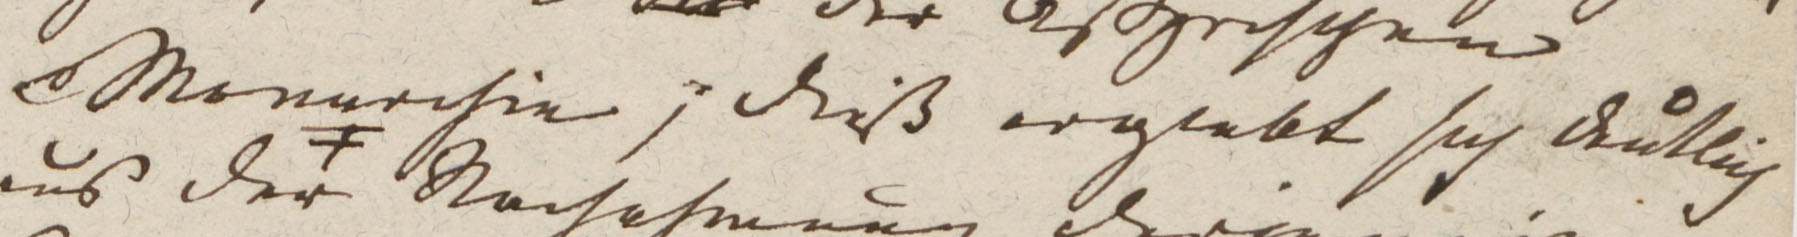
Monarchie; Diess ergiebt sich deutlich
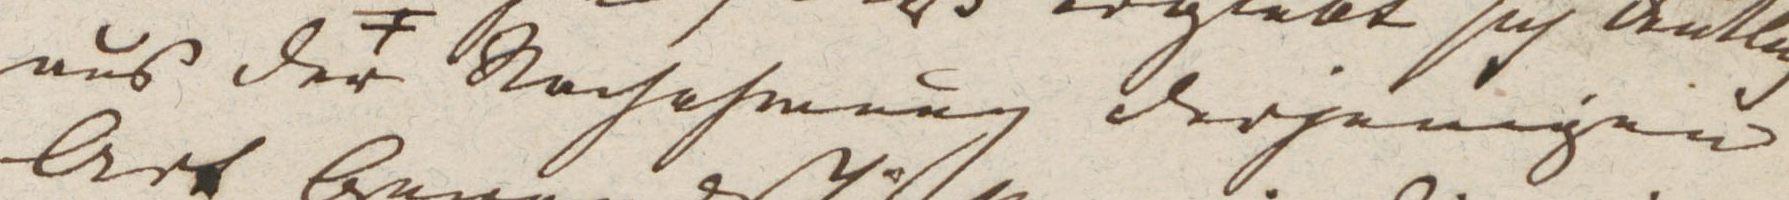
aus der % Nachahmung derjenigen
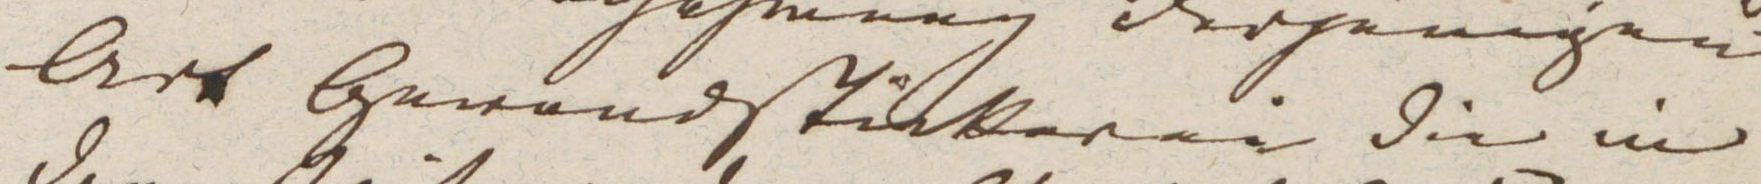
Art Gewandstickerei, die in
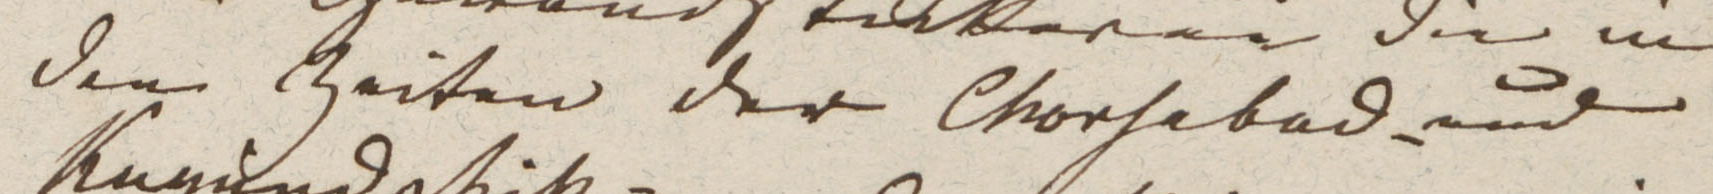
den Zeiten der Chorsabad- und
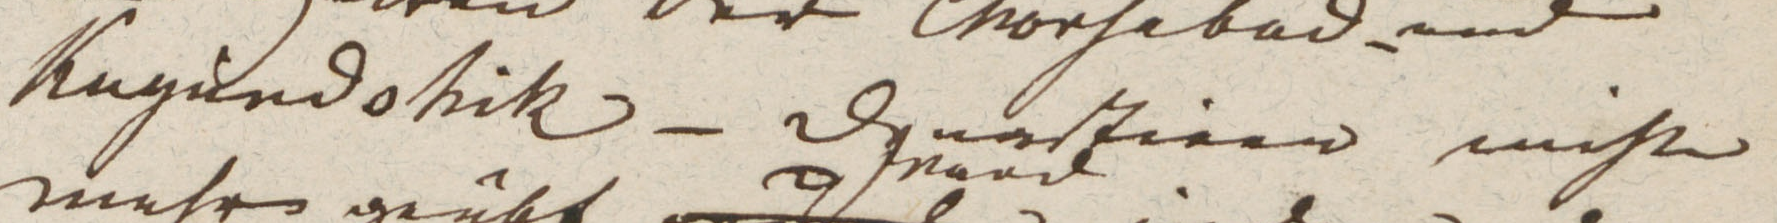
Kuundshik-Dynastieen nicht
